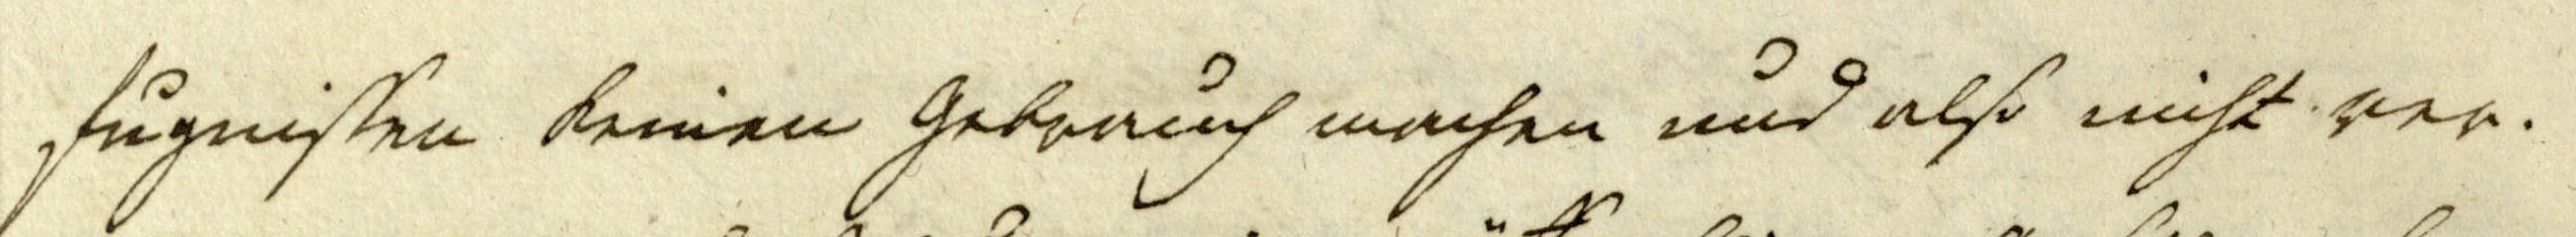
fugnissen keinen Gebrauch machen und also nicht ver¬
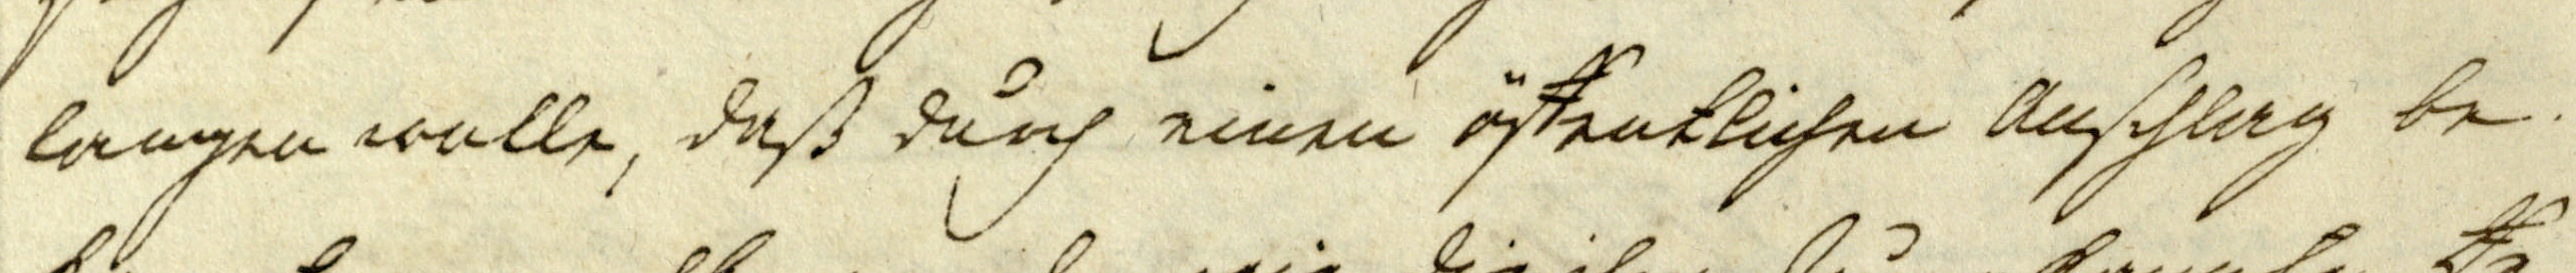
langen wolle, daß durch einen öffentlichen Anschlag be¬
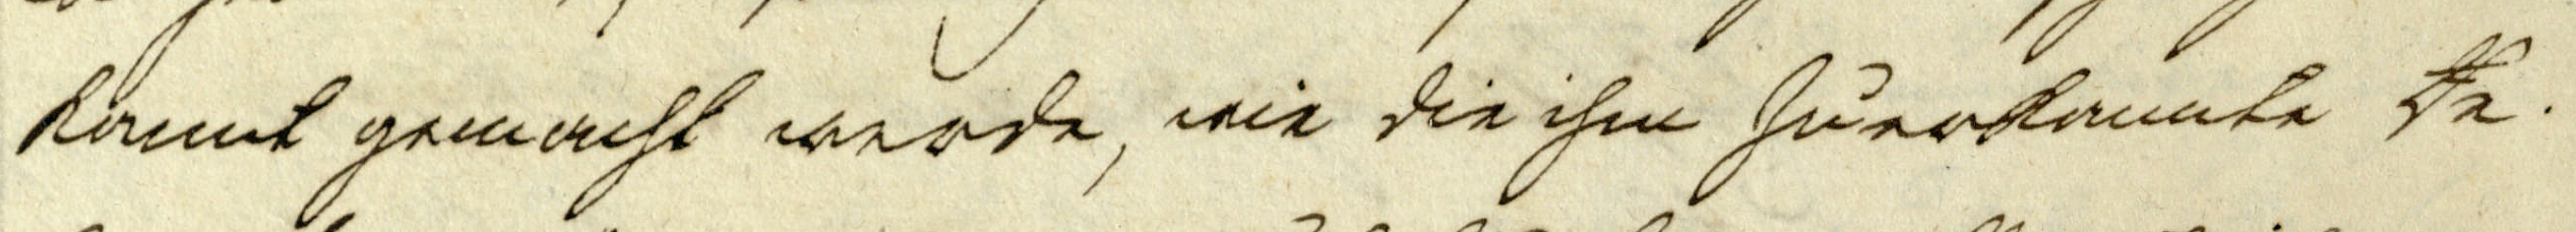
kannt gemacht werde, wie die ihm zuerkannte Re¬
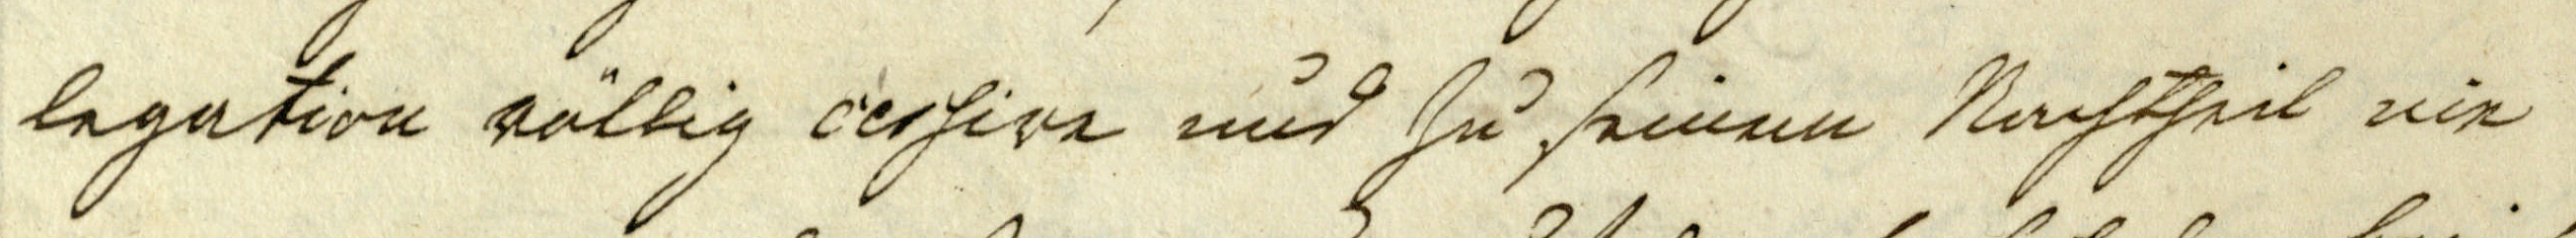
legation völlig cessire und zu seinem Nachtheil nie
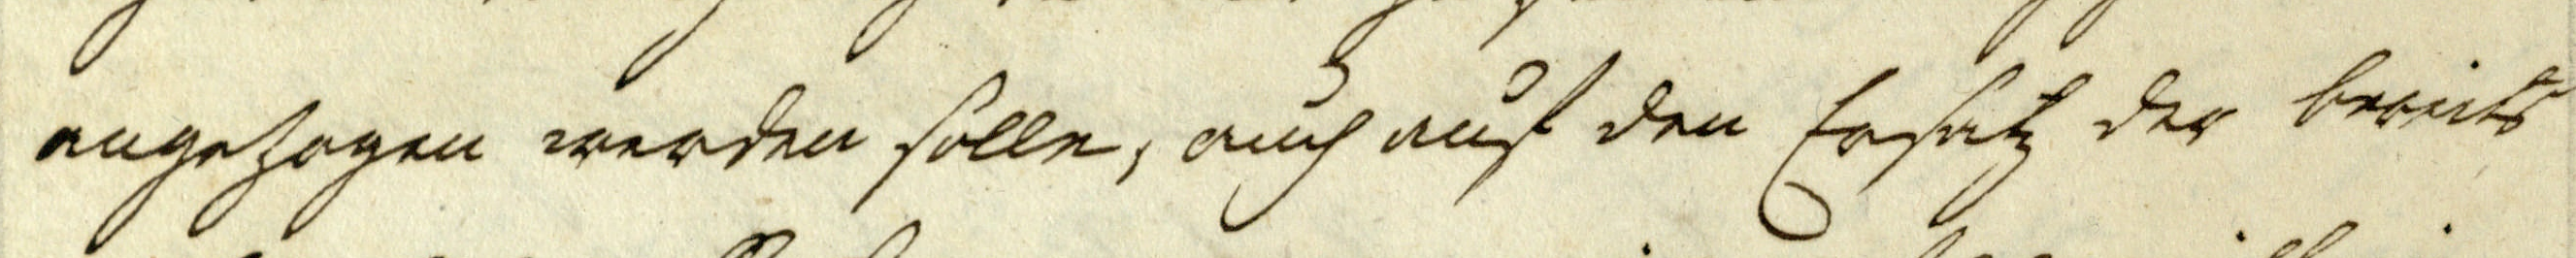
angezogen werden solle, auch auf den Ersatz der bereits
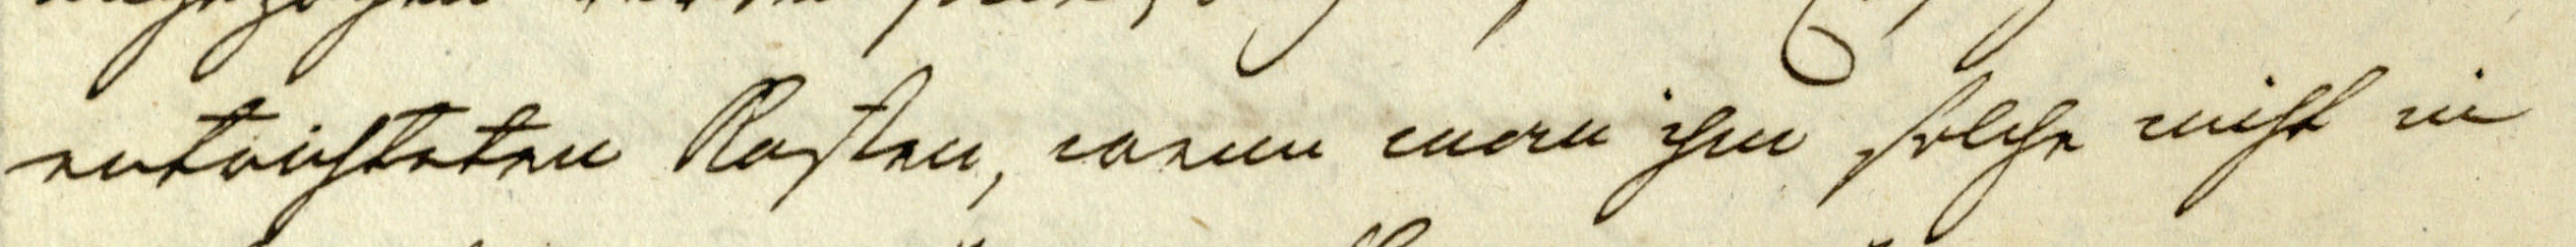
entrichteten Kosten, wenn man ihm solche nicht in
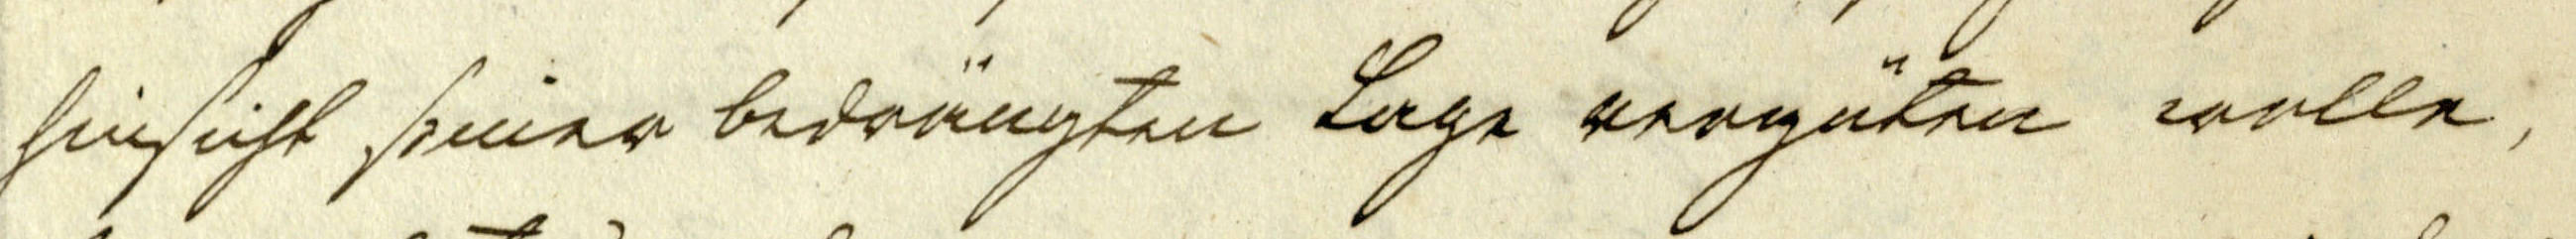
hinsicht seiner bedrängten Lage vergüten wolle,
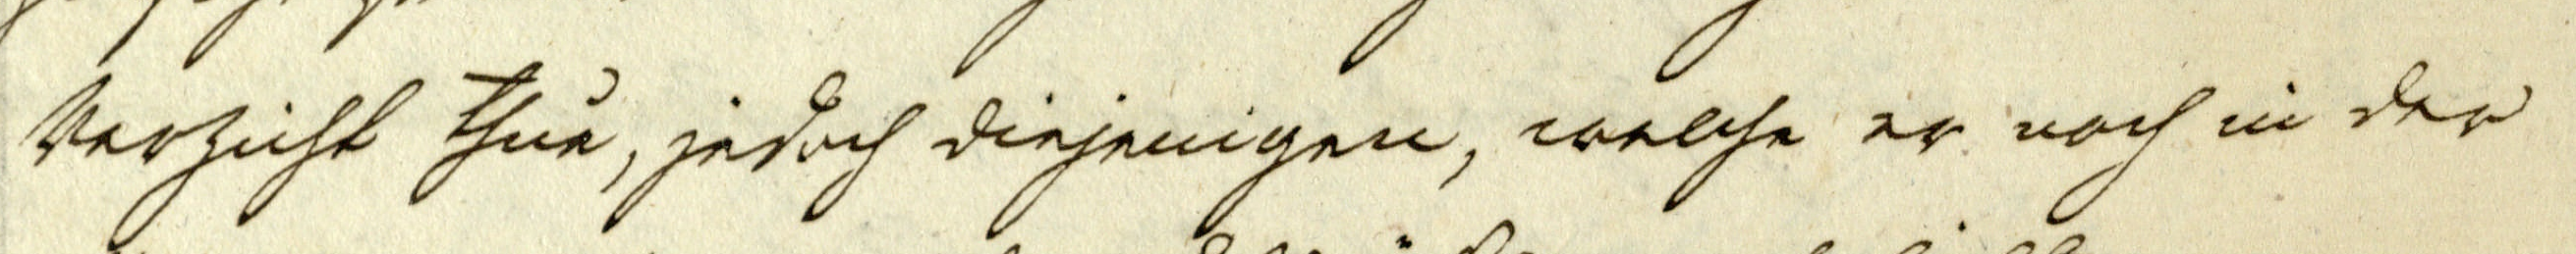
Verzicht thun, jedoch diejenigen, welche er noch in der
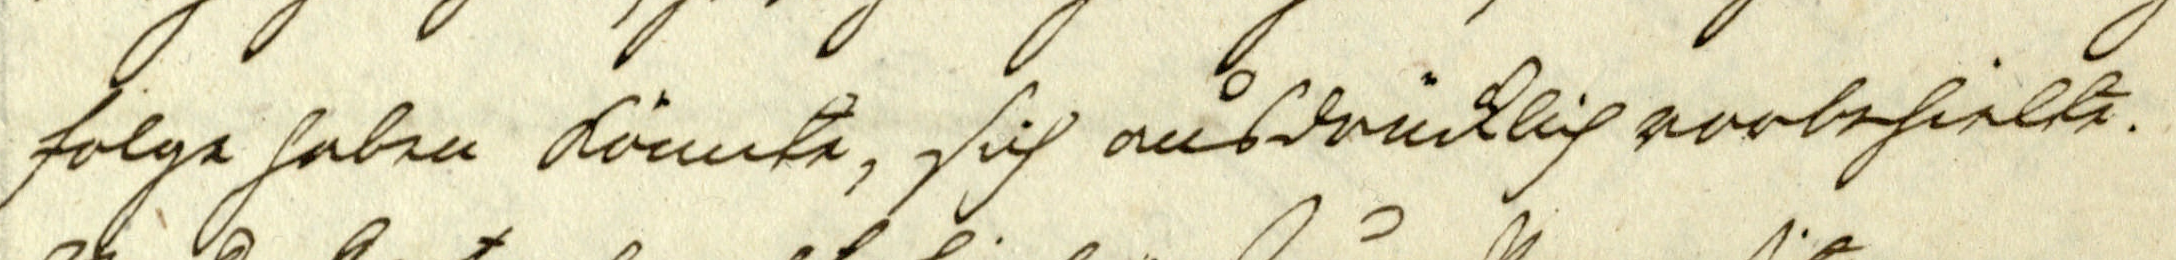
Folge haben könnte, sich ausdrücklich vorbehielte.
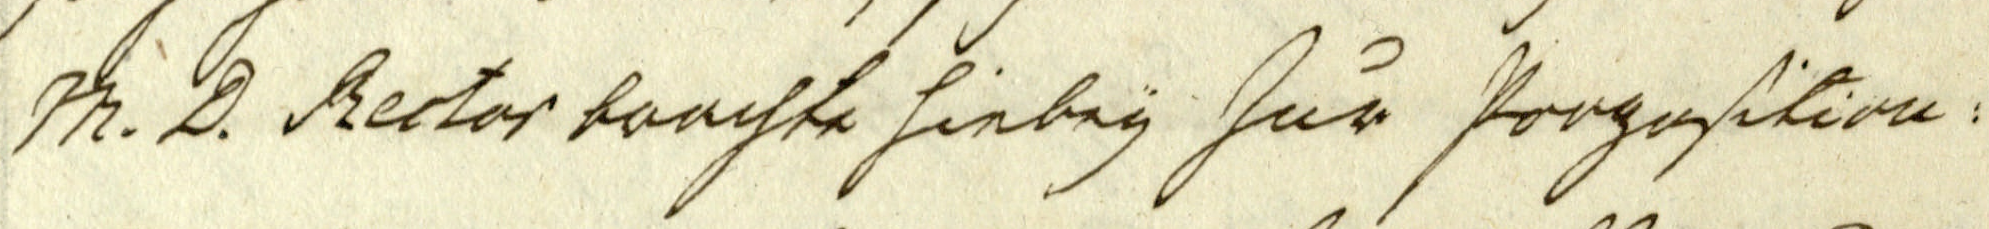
M. D. Rector brachte hiebeÿ zur Proposition:
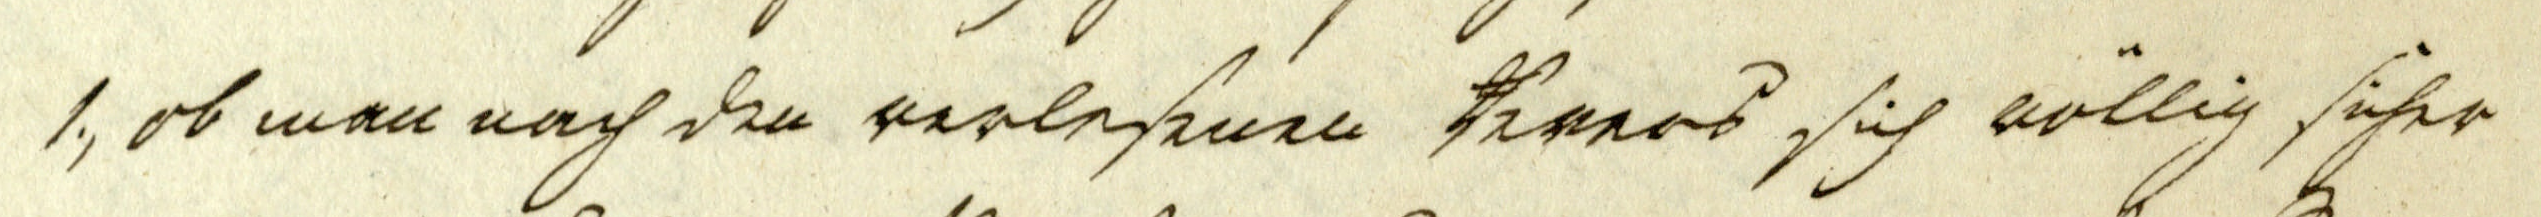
1., ob man nach den verlesenen Revers sich völlig sicher
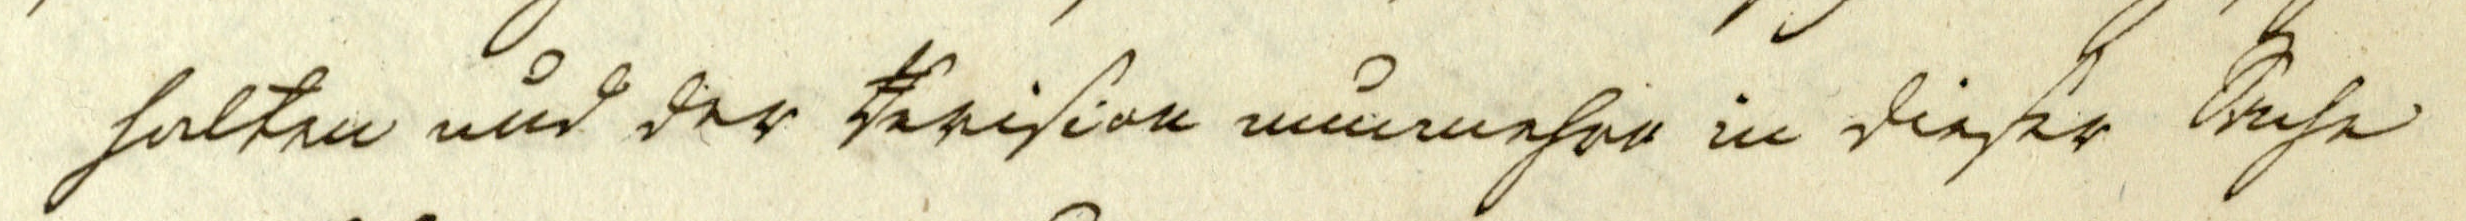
halten und der Revision nunmehro in dieser Sache
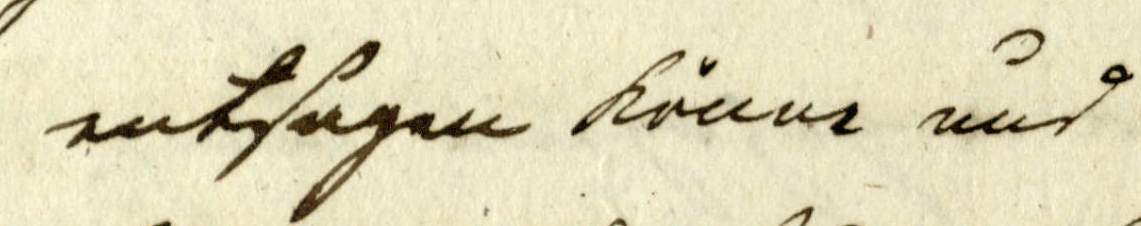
entsagen könne und
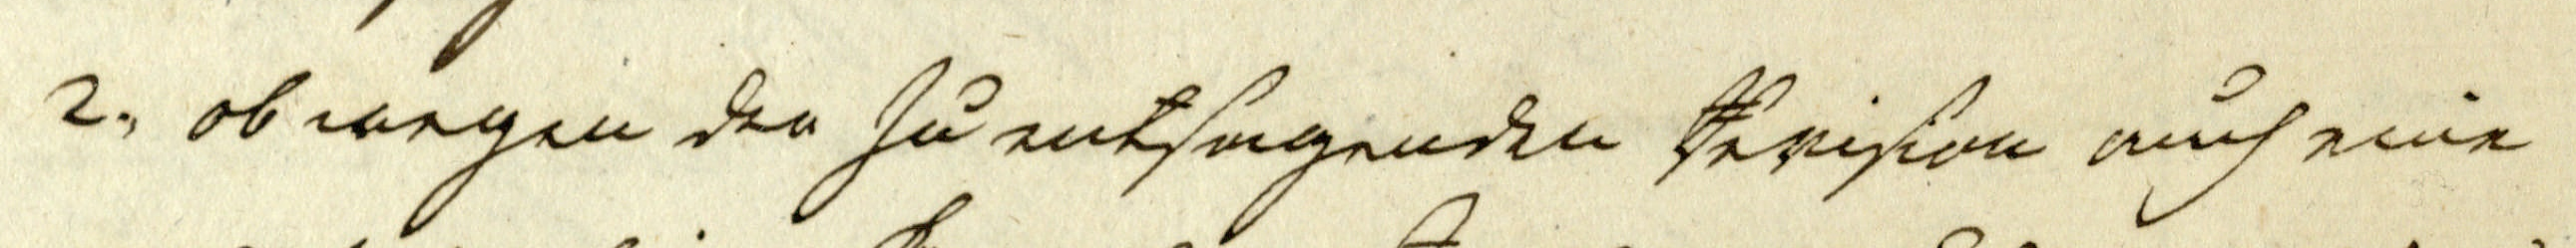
2., ob wegen der zu entsagenden Revision auch eine
